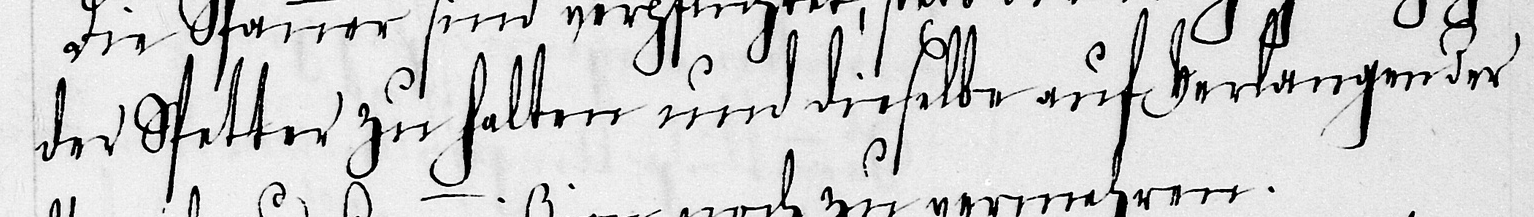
der Spetter zu halten und dieselbe auf Verlangen der
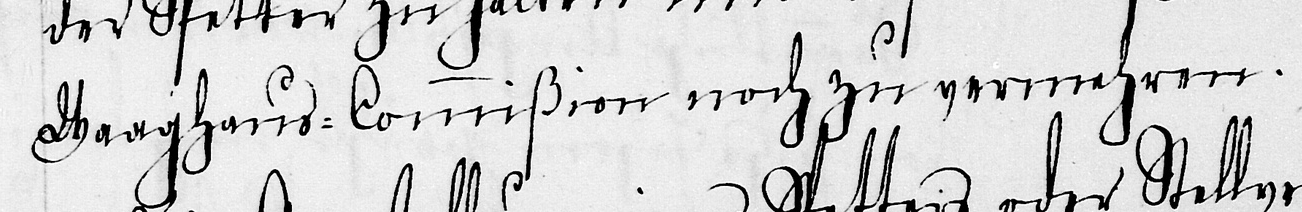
Waaghaus-Commißion noch zu vermehren.
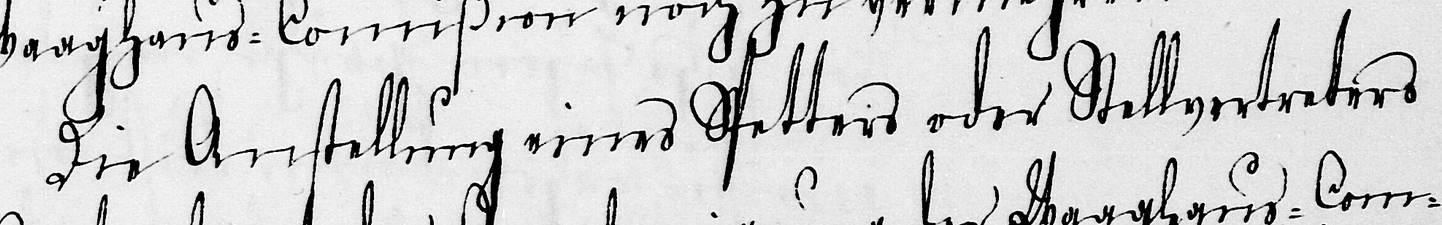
Die Anstellung eines Spetters oder Stellvertreters
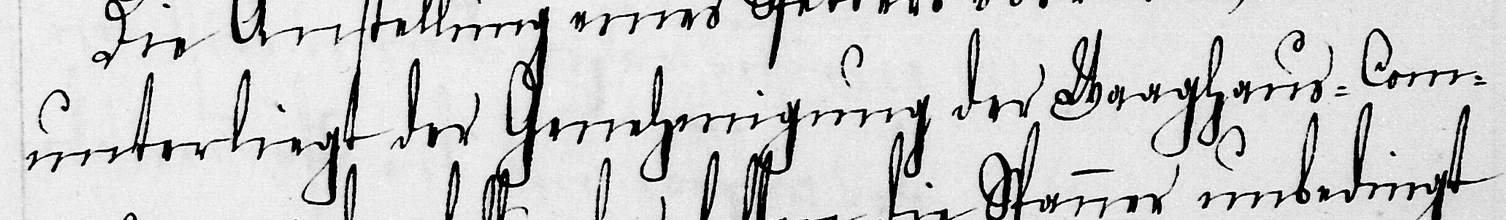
unterliegt der Genehmigung der Waaghaus-Com¬
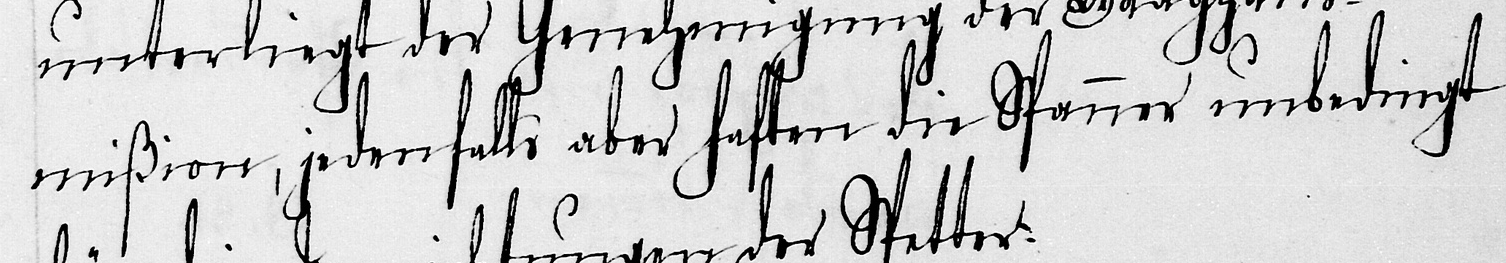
mißion, jedenfalls aber haften die Spanner unbedingt
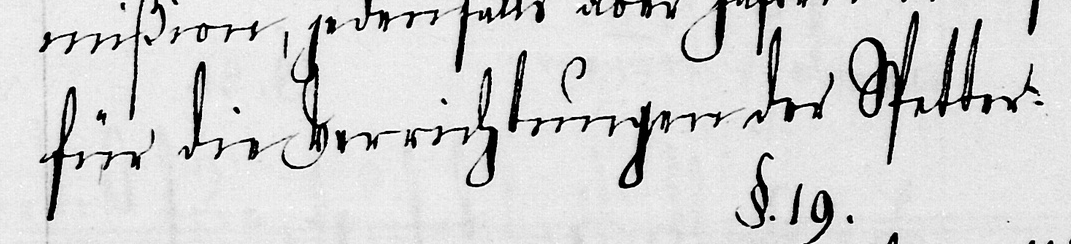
für die Verrichtungen der Spetter.
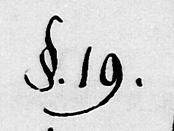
§. 19.
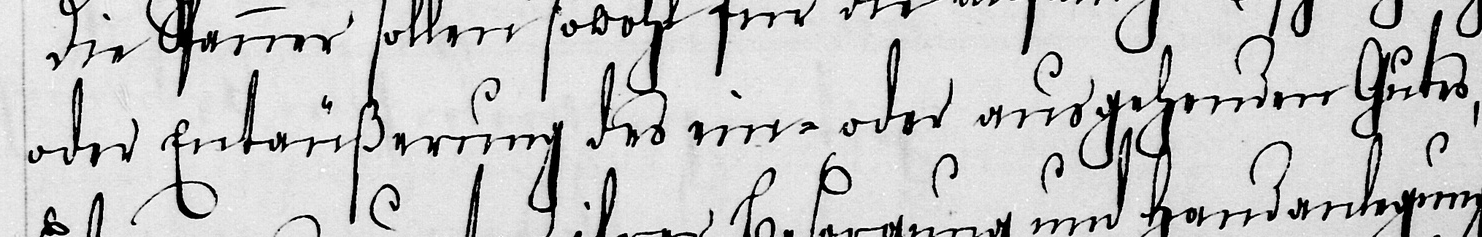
oder Entäußerung des ein- oder ausgehenden Gutes,
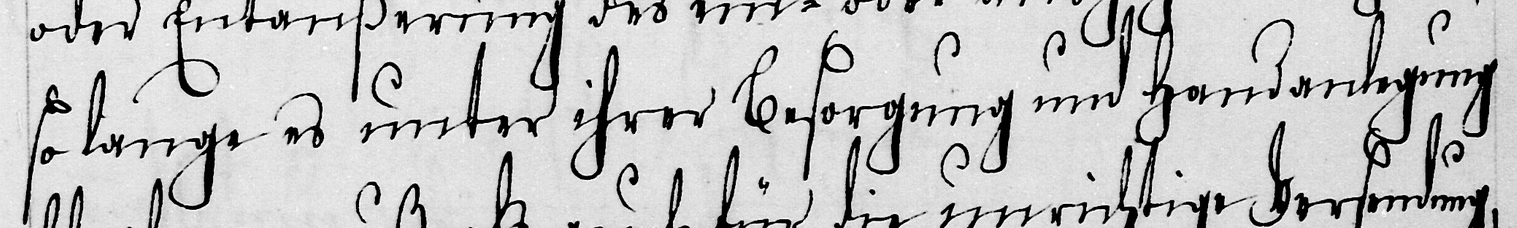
so lange es unter ihrer Besorgung und Handanlegung
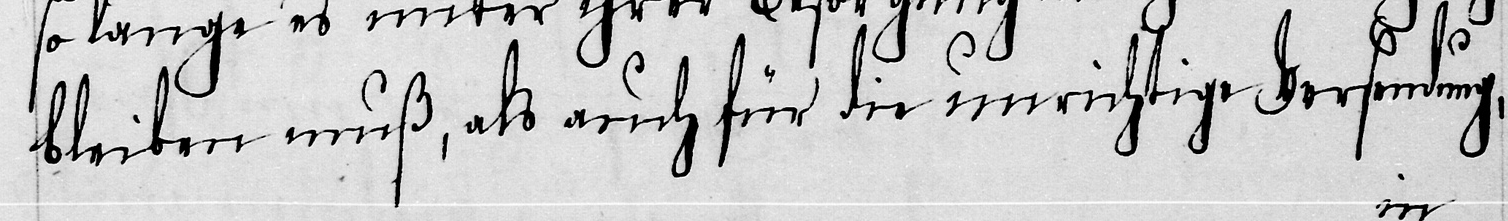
bleiben muß, als auch für die unrichtige Versendung,
